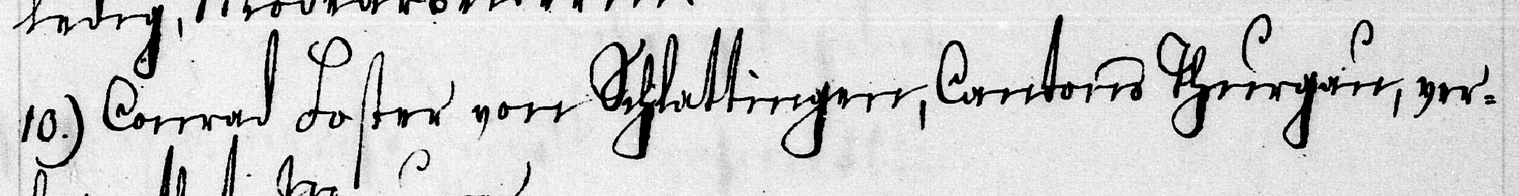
10.) Conrad Foster von Schlattingen, Cantons Thurgau, ver¬
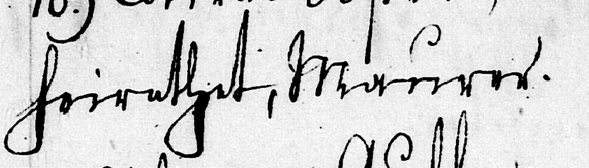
heirathet, Maurer.
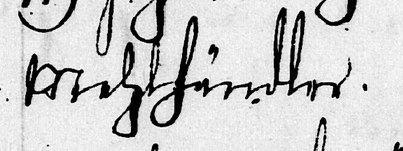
Mehlhändler.
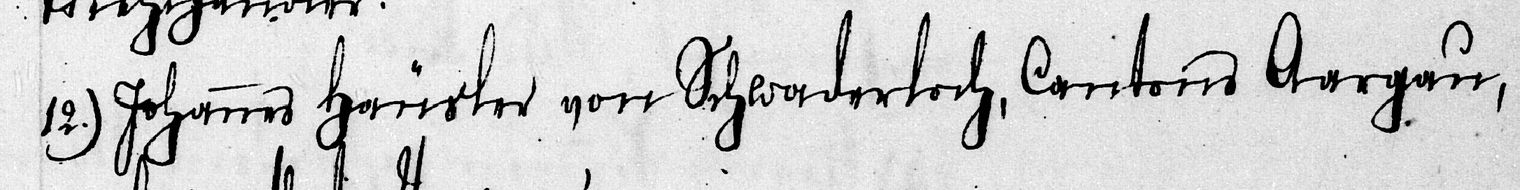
12.) Johannes Häusler von Schwaderloch, Cantons Aargau,
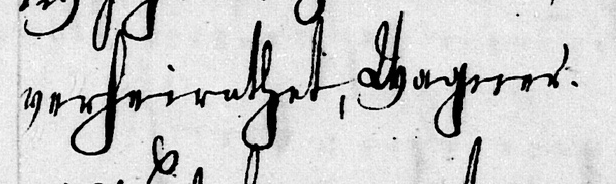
verheirathet, Wagner.
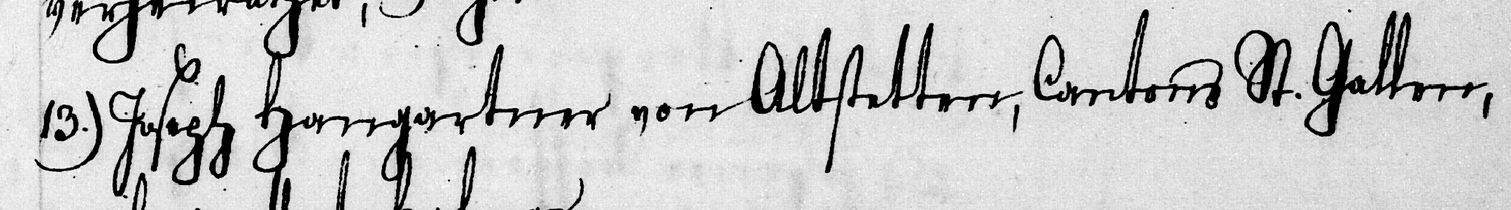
13.) Joseph Hangartner von Altstetten, Cantons St. Gallen,
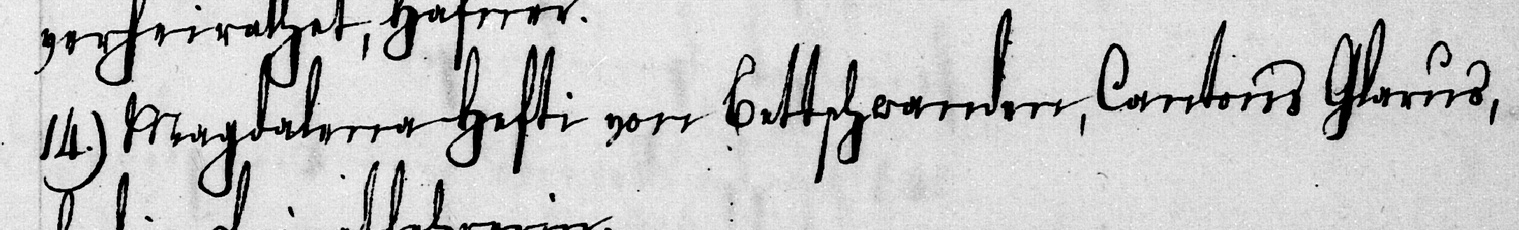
14.) Magdalena Hefti von Bettschwanden, Cantons Glarus,
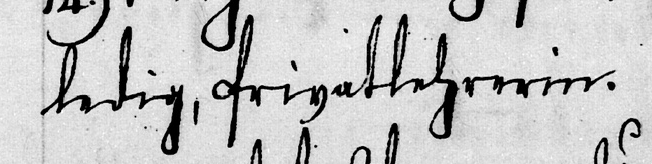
ledig, Privatlehrerin.
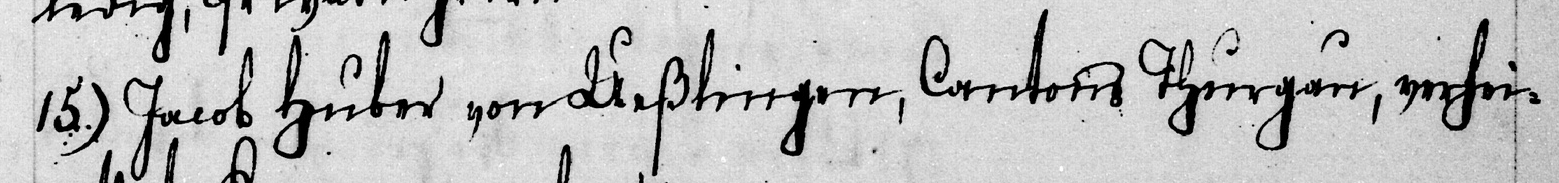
15.) Jacob Huber von Ueßlingen, Cantons Thurgau, verhei¬
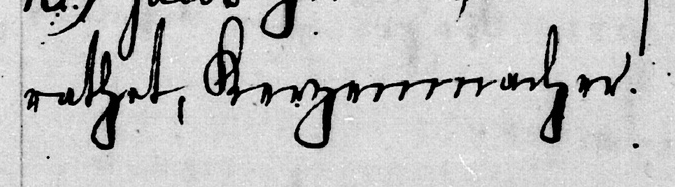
rathet, Kerzenmacher.
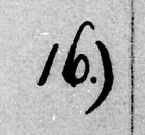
11.)
